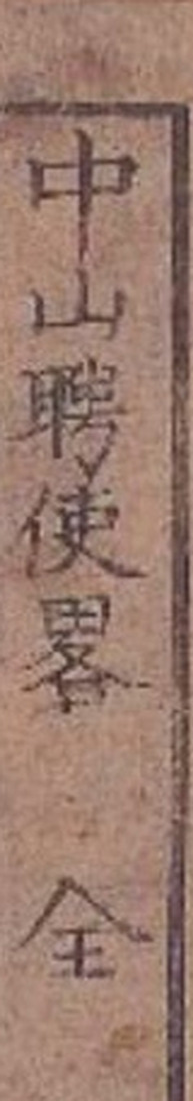中山聘使略全

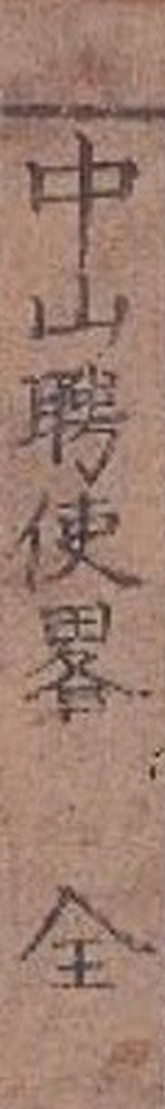中山聘使略全
